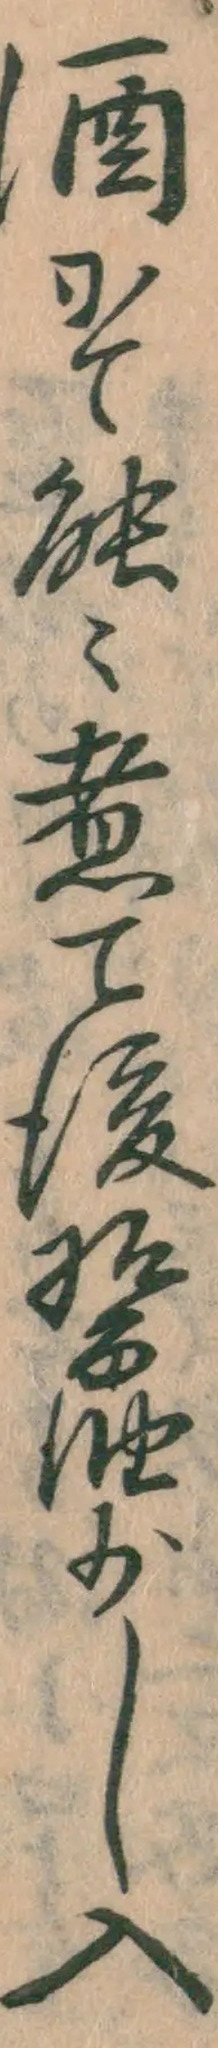酒にて能々煮て後醤油少し入
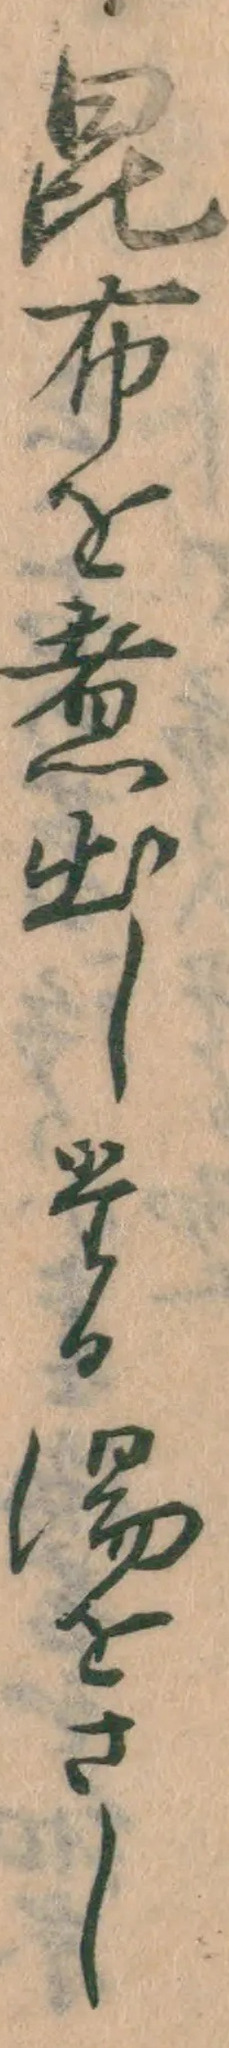昆布を煮出したる湯をさし
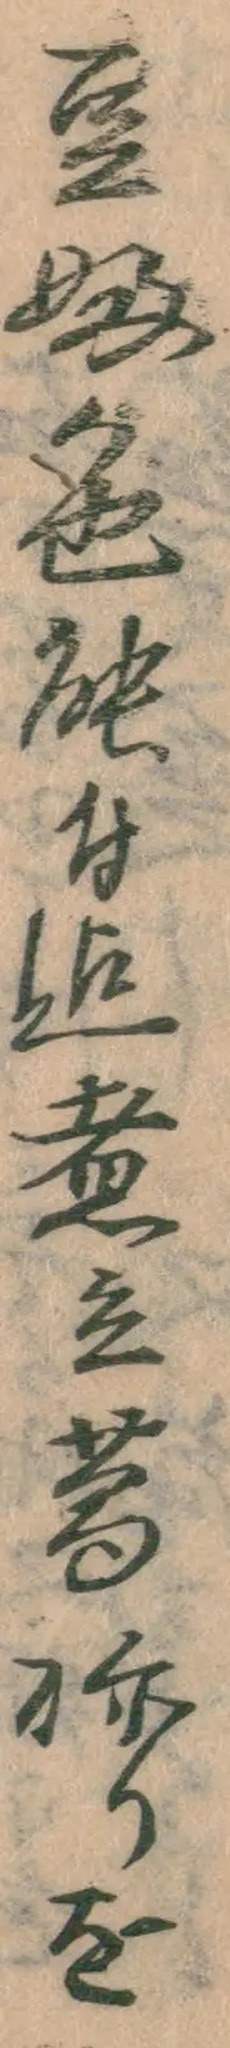豆ふ色能付迄煮立葛ねりを
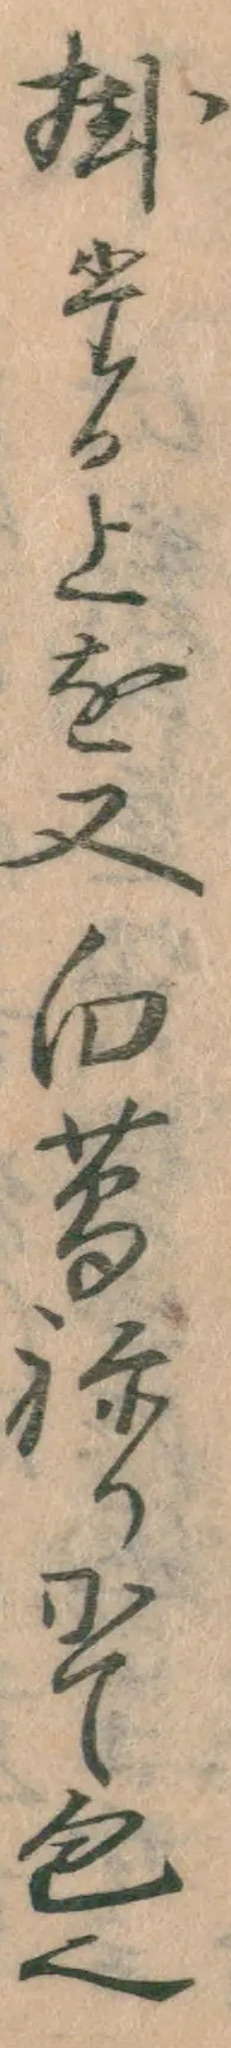掛たる上を又白葛ねりにて包也
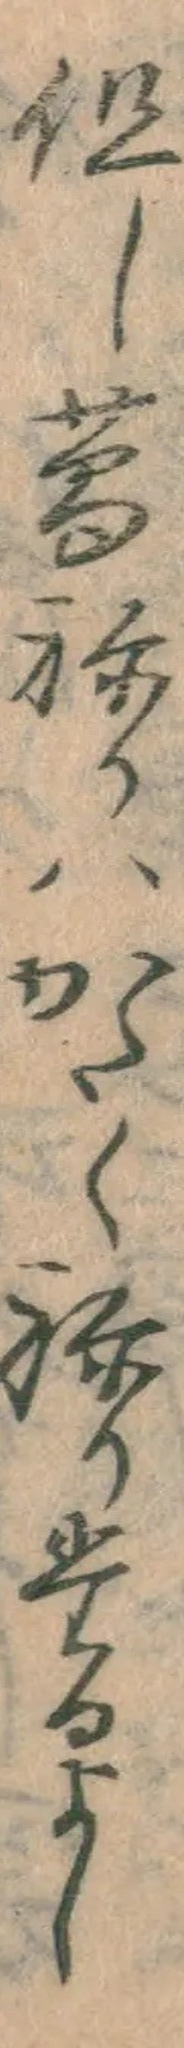但し葛ねりはかたくねりたるよし
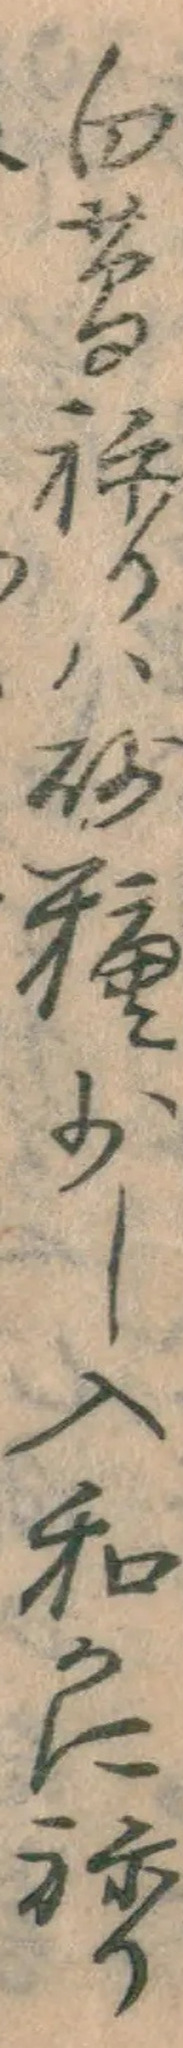白葛ねりは砂糖少し入和かにねり
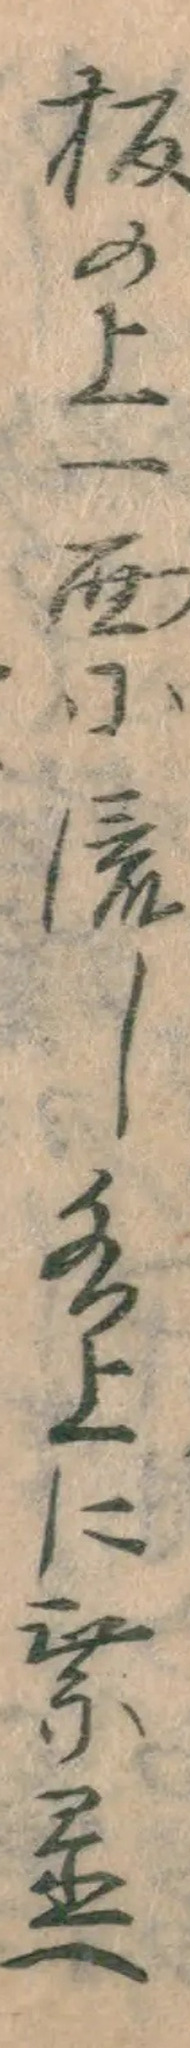板の上一面に流し水上に乗置へ
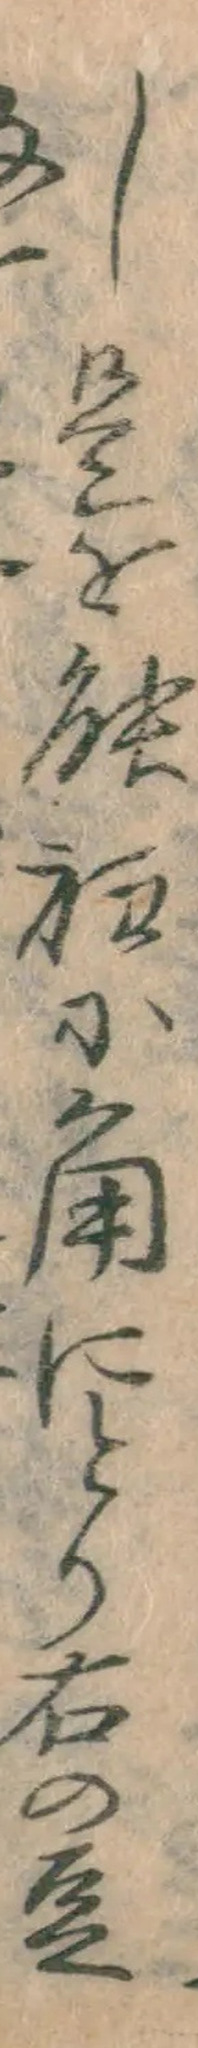し是を能程に角にとり右の豆
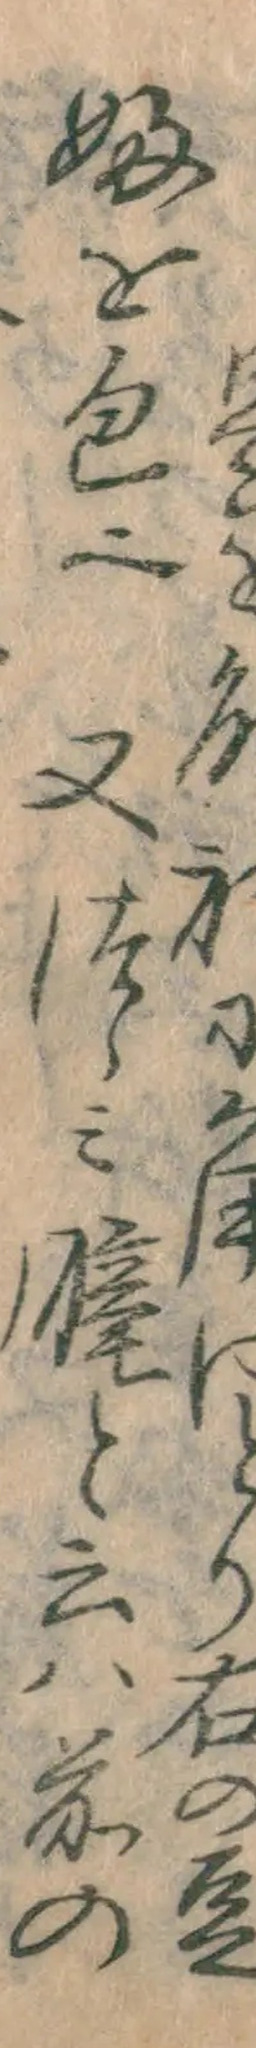ふを包也又つゝみ朧と云は前の
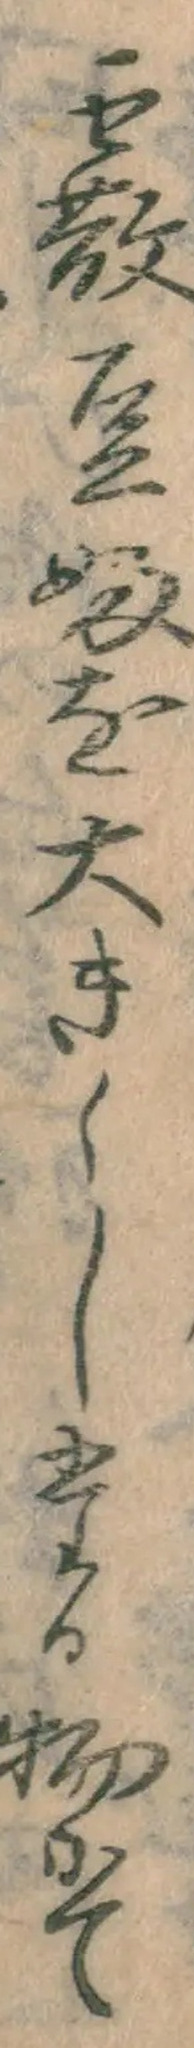霰豆ふを大きくしたる物にて
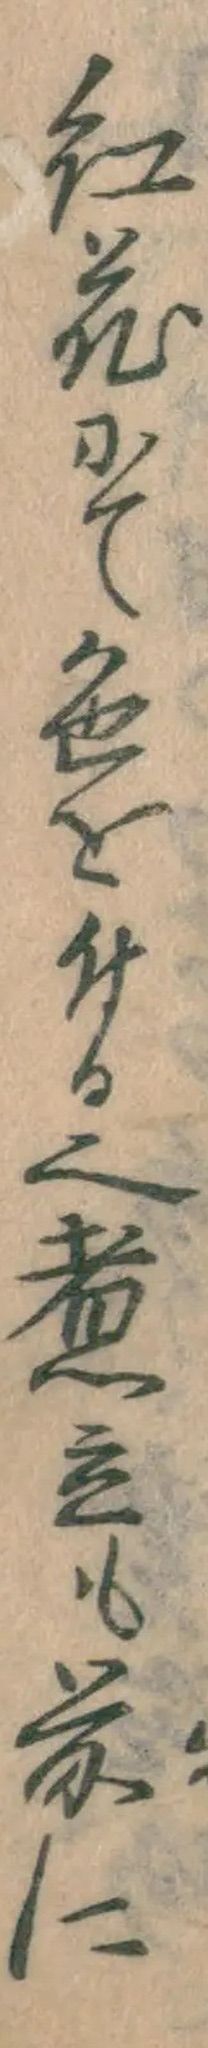紅花にて色を付る也煮立も前に

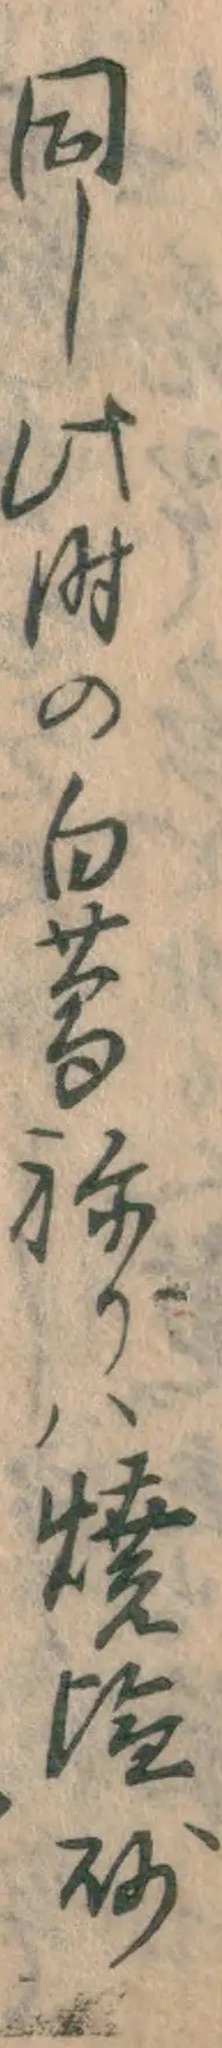同し此時の白葛ねりは焼塩砂
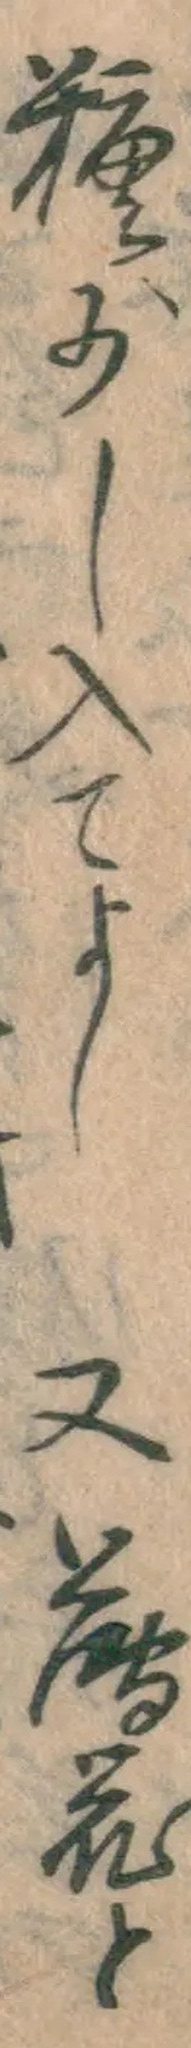糖少し入てよし又薄花と
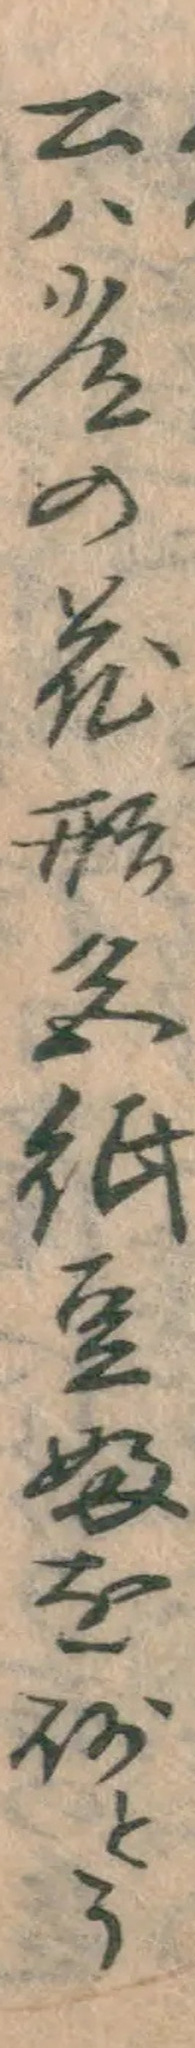云は常の花形色紙豆ふを砂とう
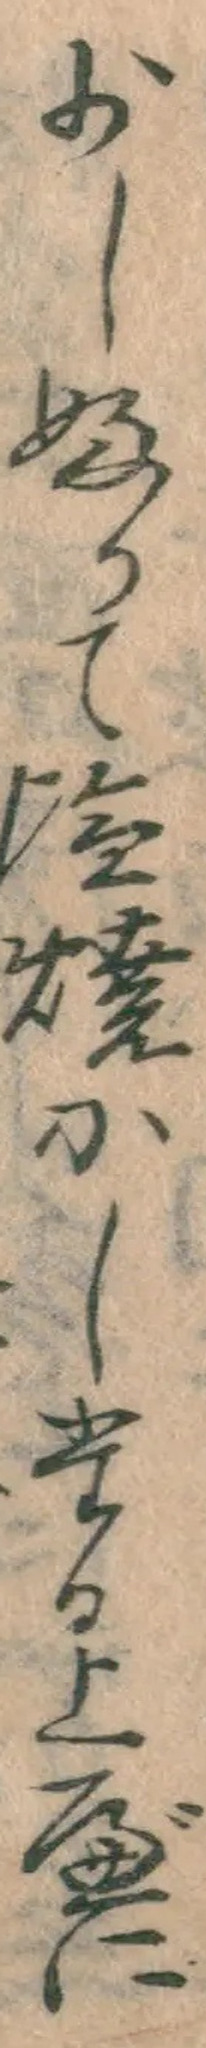少しふりて塩焼にしたる上べに
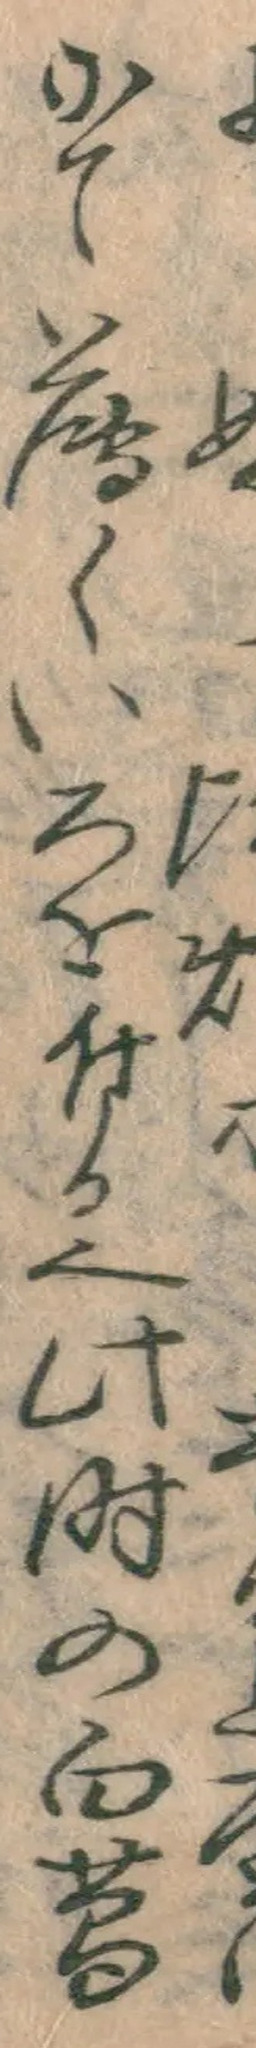にて薄くいろを付る也此時の白葛
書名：豆腐百珍余録
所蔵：国立国会図書館 National Diet Library, JAPAN
